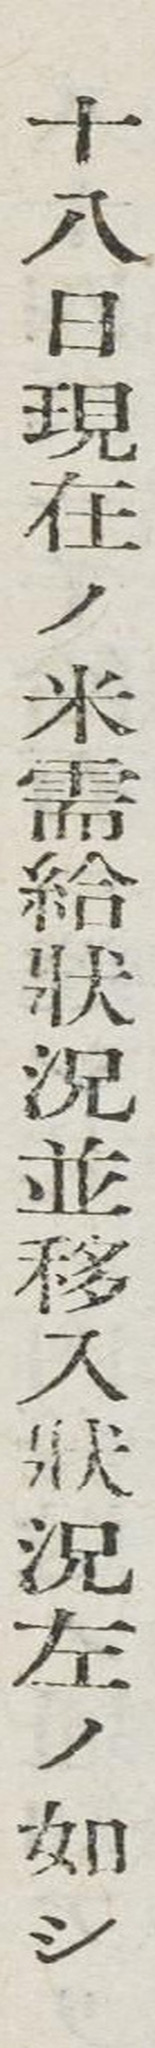十八日現在ノ米需給状況並移入状況左ノ如シ
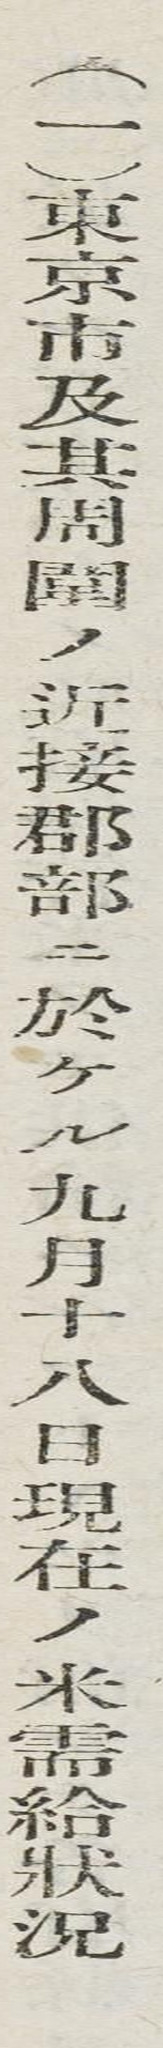東京市及其周囲ノ近接郡部ニ於ケル九月十八日現在ノ米需給状況
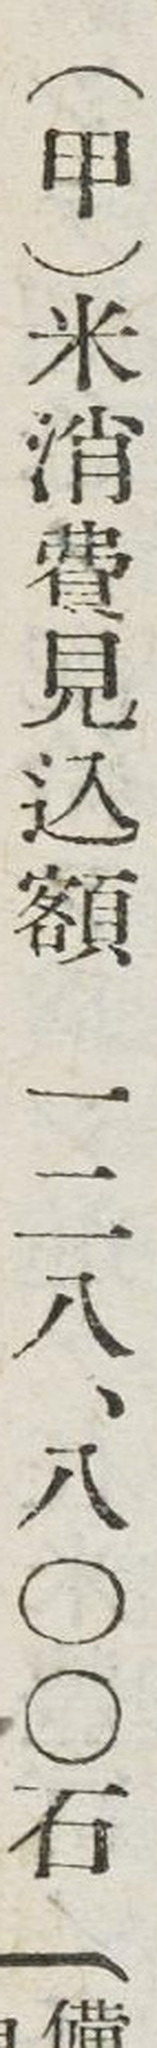米消費見込額一二八、八〇〇石
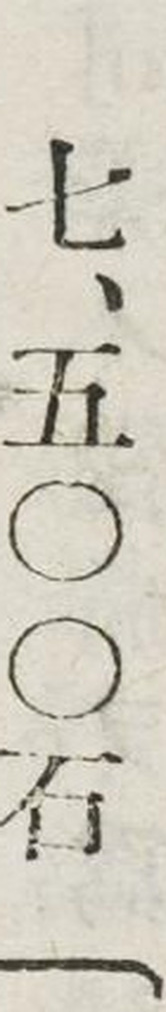七、五〇〇石
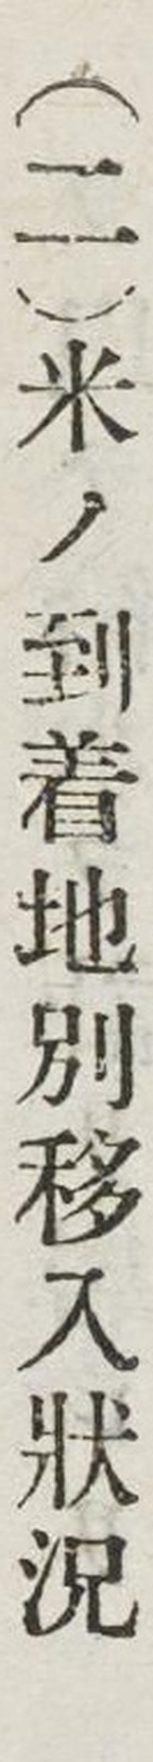米ノ到着地別移入状況
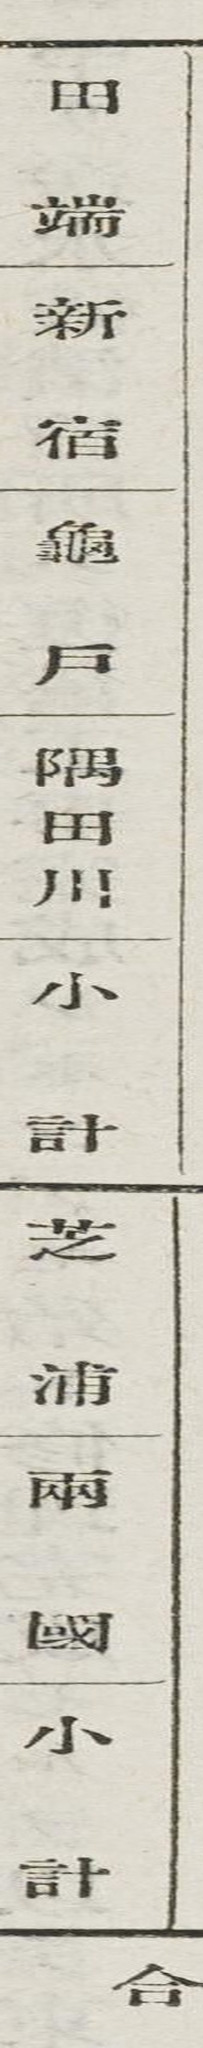田端新宿亀戸隅田川小計芝浦両国小計合計
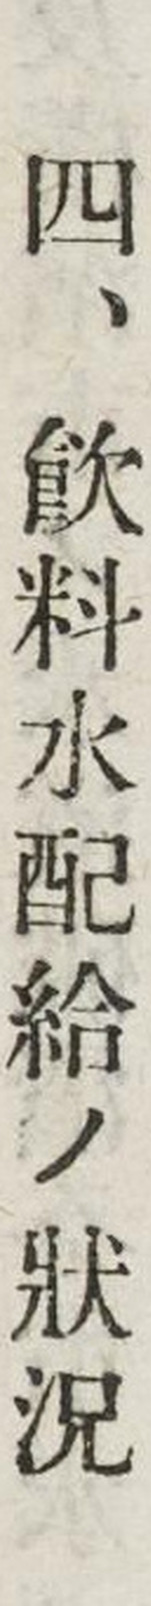四、飲料水配給ノ状況

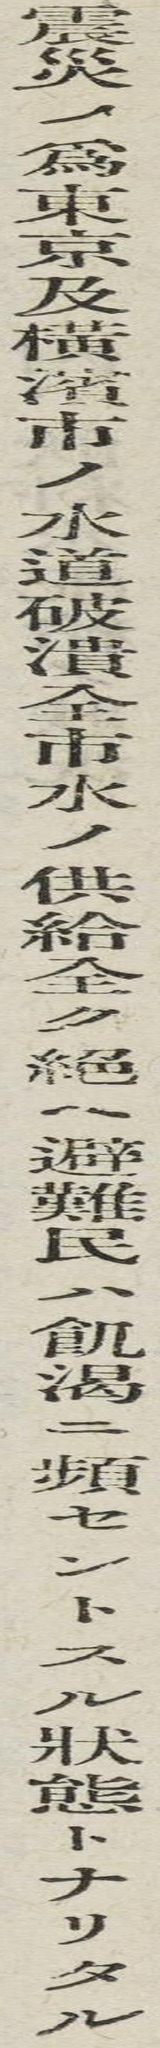震災ノ為東京及横浜市ノ水道破潰全市水ノ供給全ク絶ヘ避難民ハ飢渇ニ頻セントスル状態トナリタル
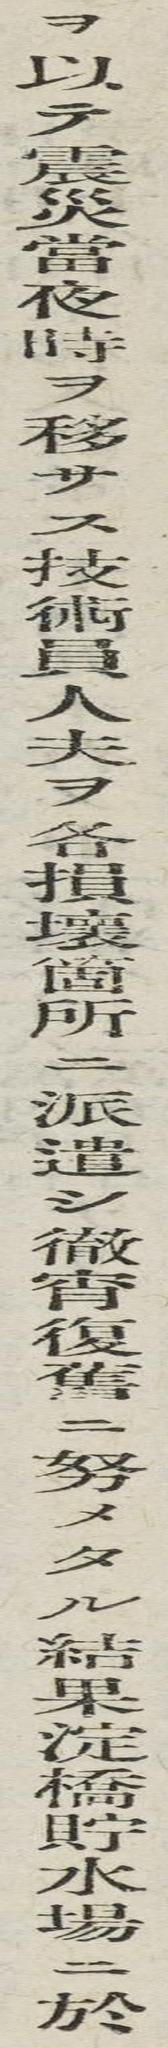ヲ以テ震災当夜時ヲ移サス技術員人夫ヲ各損壊箇所ニ派遣シ徹宵復旧ニ努メタル結果淀橋貯水場ニ於
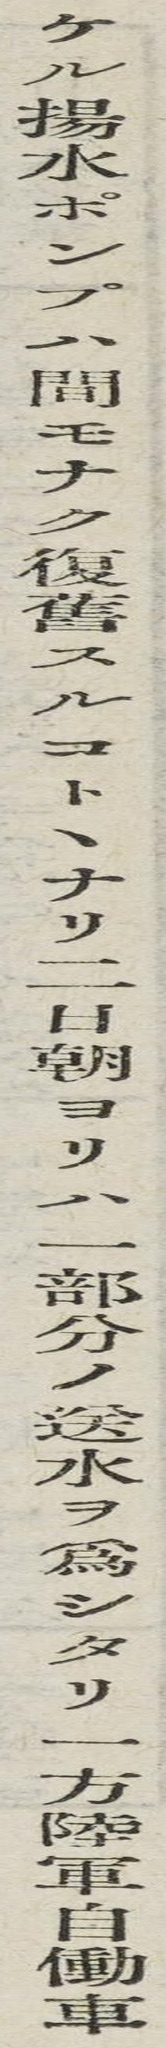ケル揚水ポンプハ間モナク復旧スルコトヽナリ二日朝ヨリハ一部分ノ送水ヲ為シタリ一方陸軍自働車
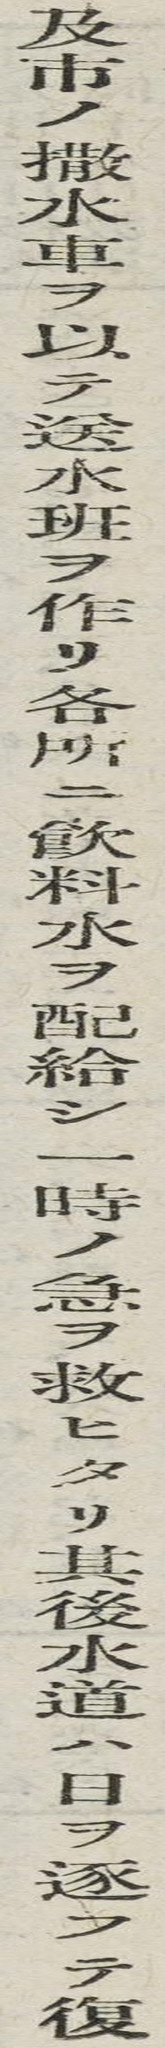及市ノ撒水車ヲ以テ送水班ヲ作リ各所ニ飲料水ヲ配給シ一時ノ急ヲ救ヒタリ其後水道ハ日ヲ遂フテ復
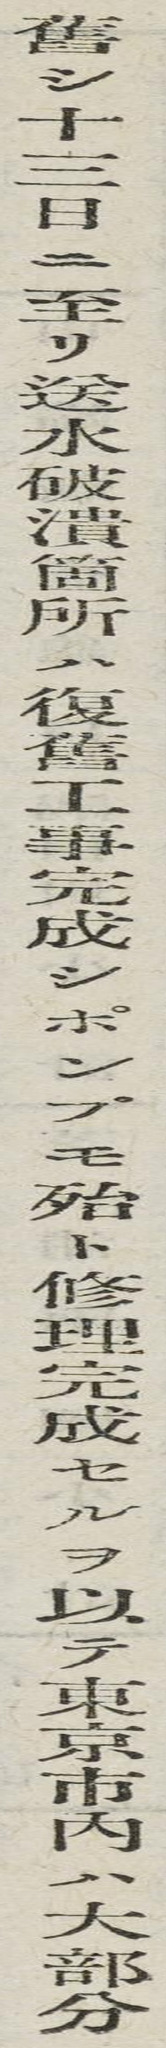旧シ十三日ニ至リ送水破潰箇所ハ復旧工事完成シポンプモ殆ト修理完成セルヲ以テ東京市内ハ大部分
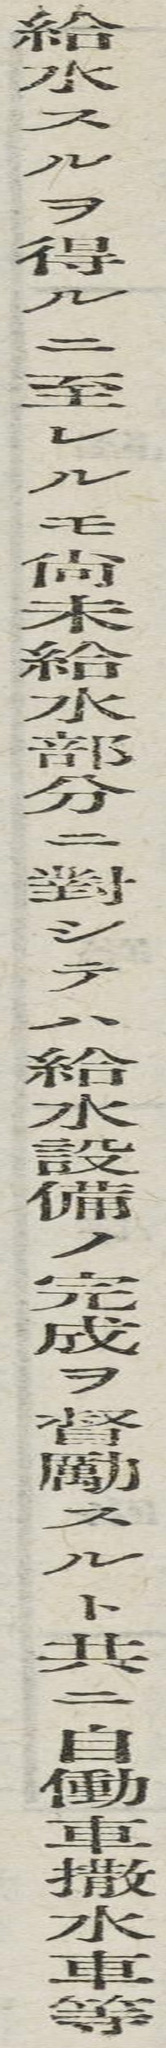給水スルヲ得ルニ至レルモ尚未給水部分ニ対シテハ給水設備ノ完成ヲ督励スルト共ニ自働車撒水車等
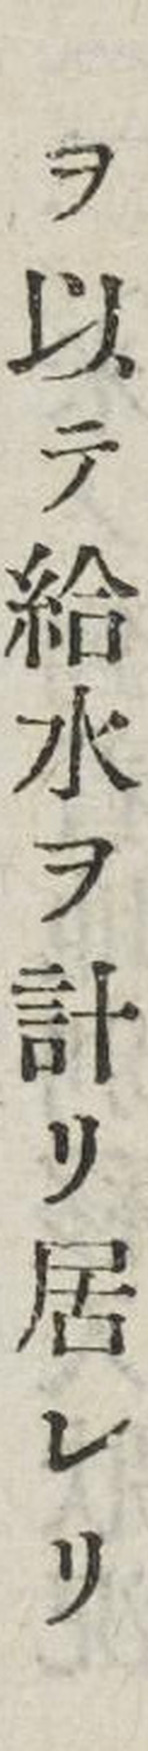ヲ以テ給水ヲ計リ居レリ
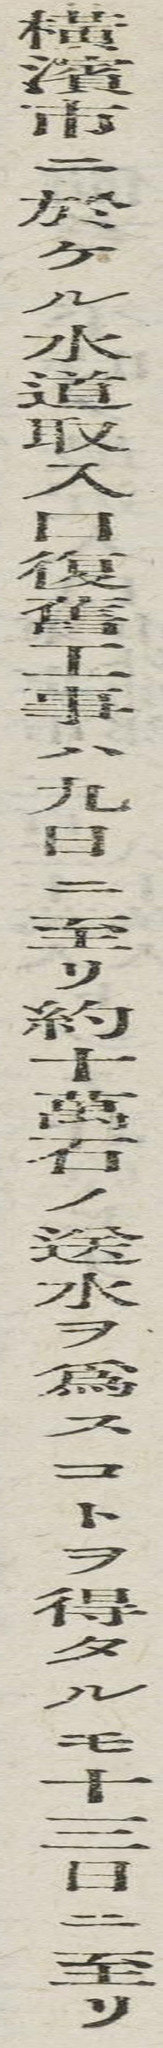横浜市ニ於ケル水道取水口復旧工事ハ九日ニ至リ約十万石ノ送水ヲ為スコトヲ得タルモ十三日ニ至リ
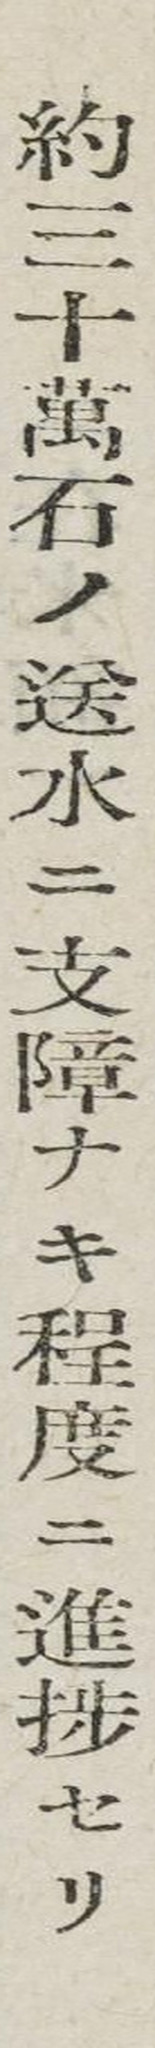約三十万石ノ送水ニ支障ナキ程度ニ進捗セリ
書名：震災被害状況並救護施設概要
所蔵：東京大学地震研究所図書室 Earthquake Research Institute Library, The University of Tokyo, JAPAN
